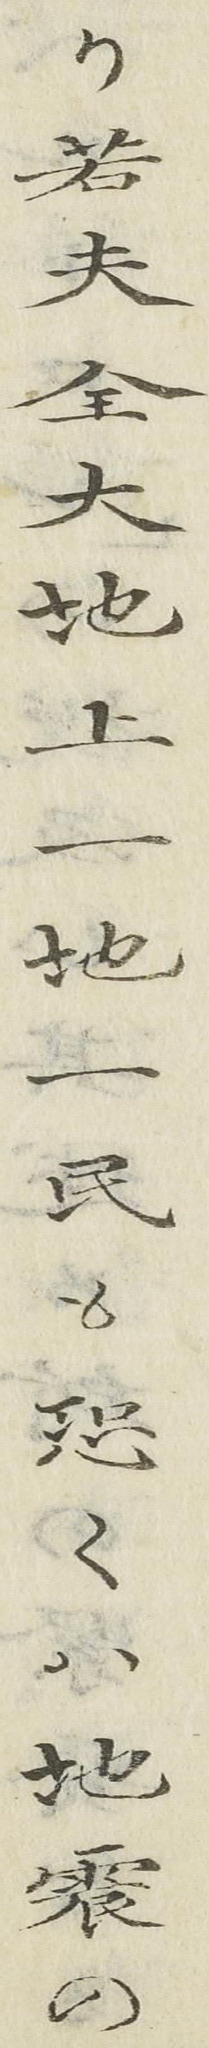り若夫全大地上一地一民も恐くは地震の
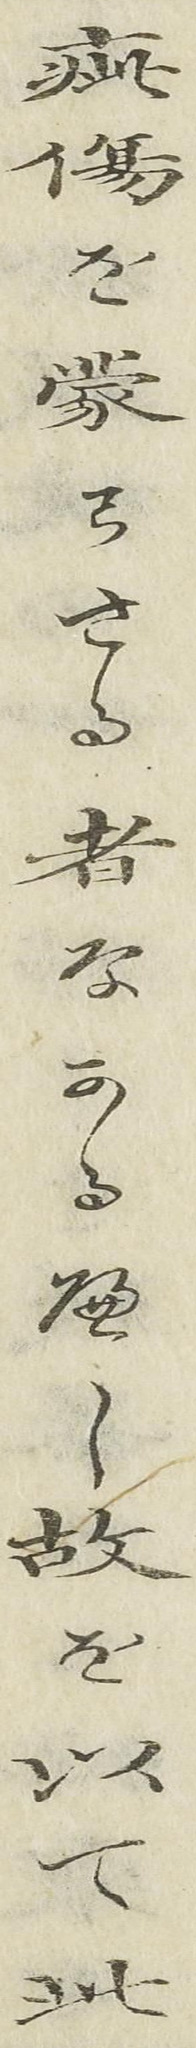疵傷を蒙らさる者なかるへし故を以て此
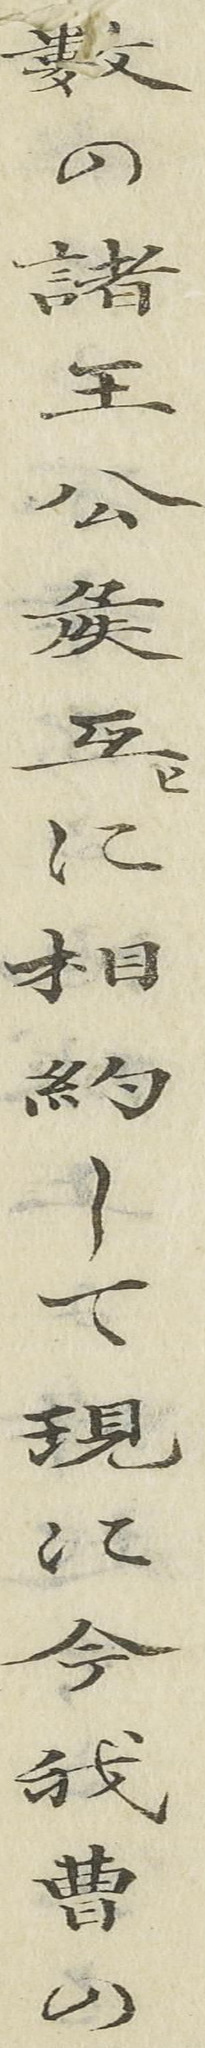数の諸王公侯互相約して現に今我曹の

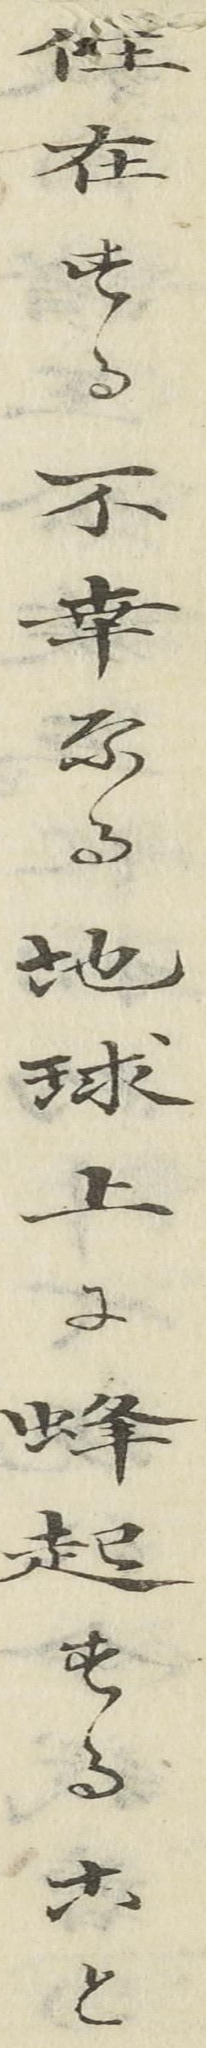住在する不幸なる地球上に蜂起すること
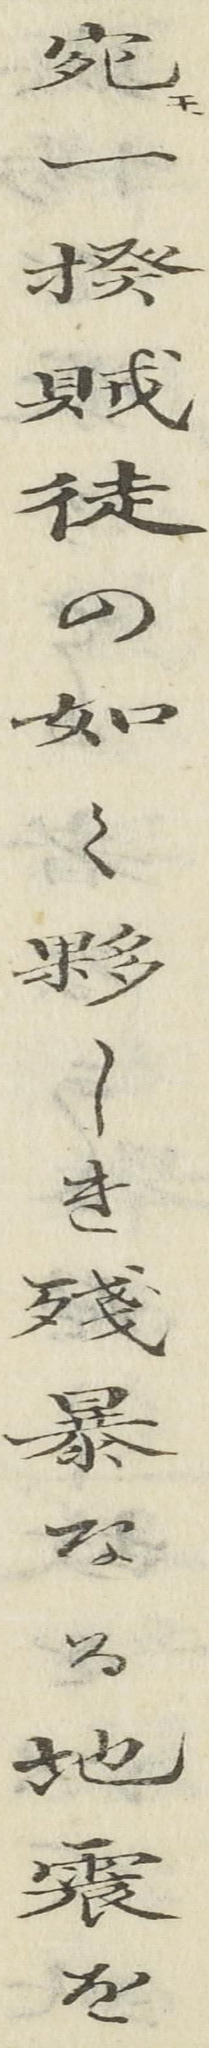宛一揆賊徒の如く夥しき残暴なる地震を
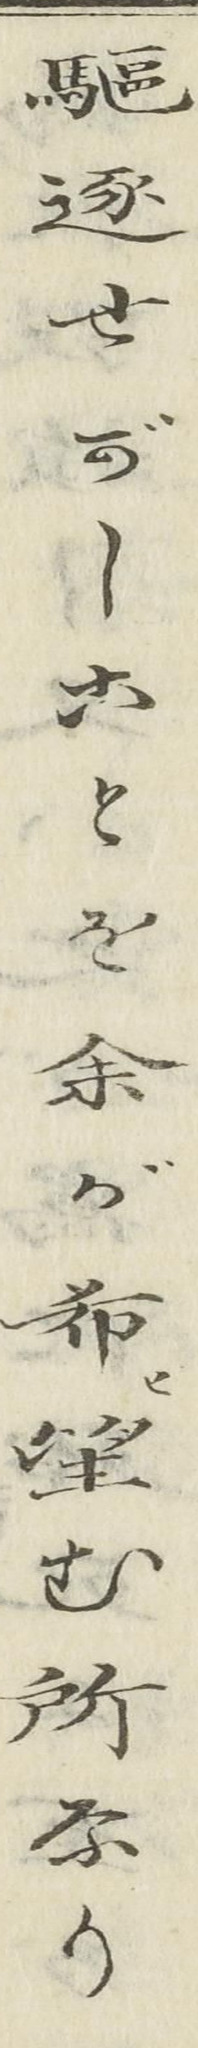駆逐せがしことを余が希ひ望む所なり
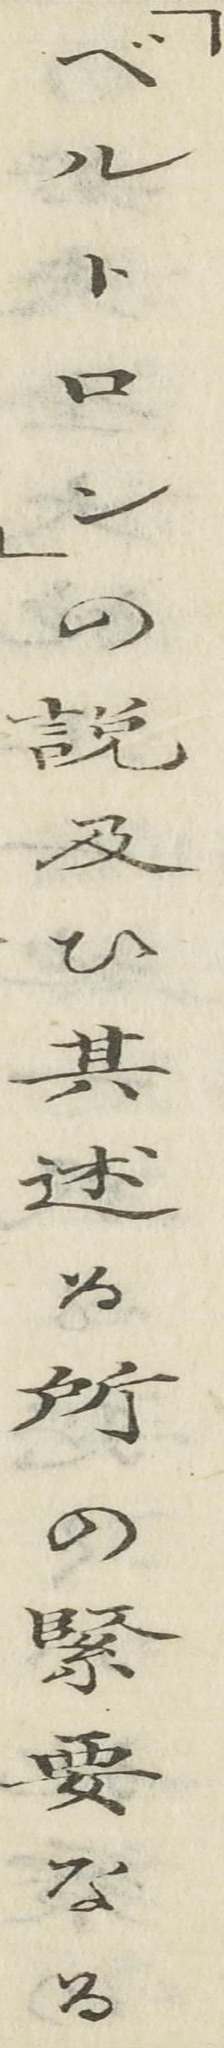「ベルトロン」の説及び其述る所の緊要なる
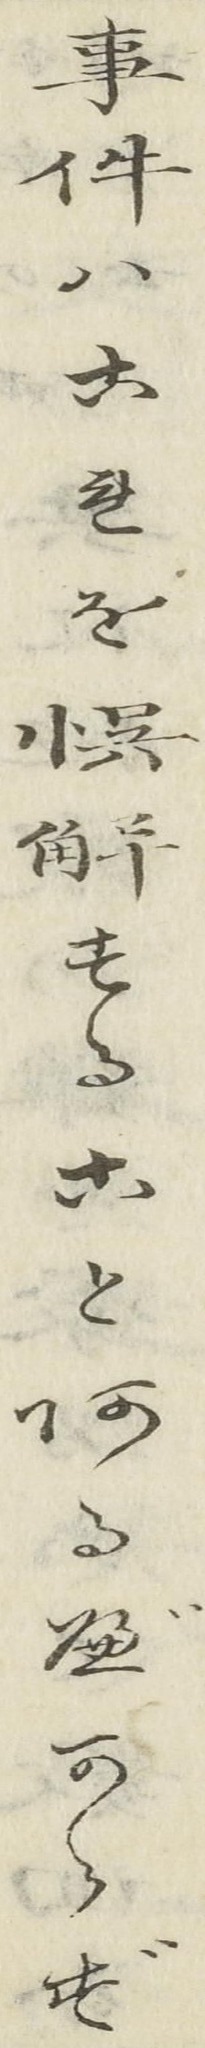事件はこれを誤解することあるべからず
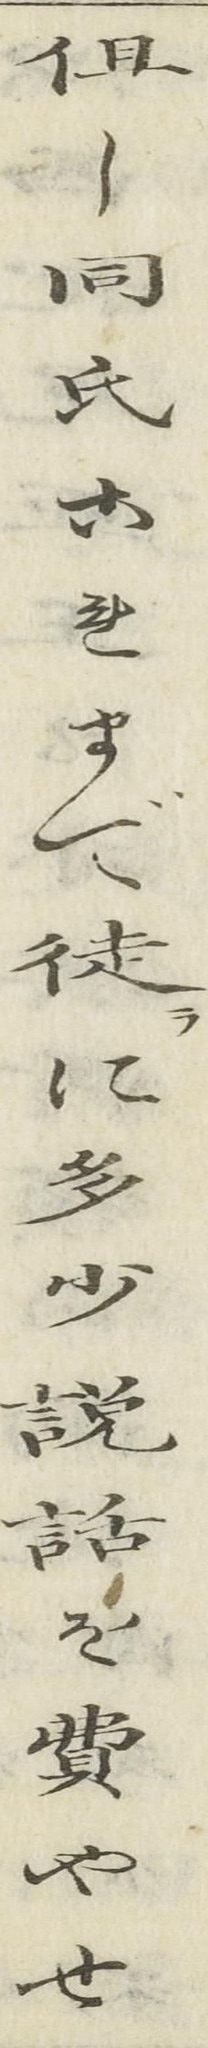但し同氏これまで徒らに多少説話を費やせ
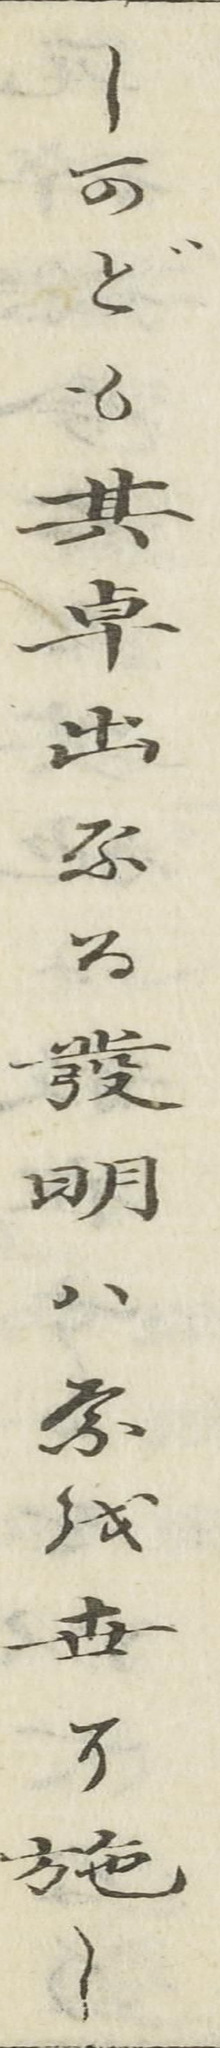しかども其卓出なる発明はなおを世に施し
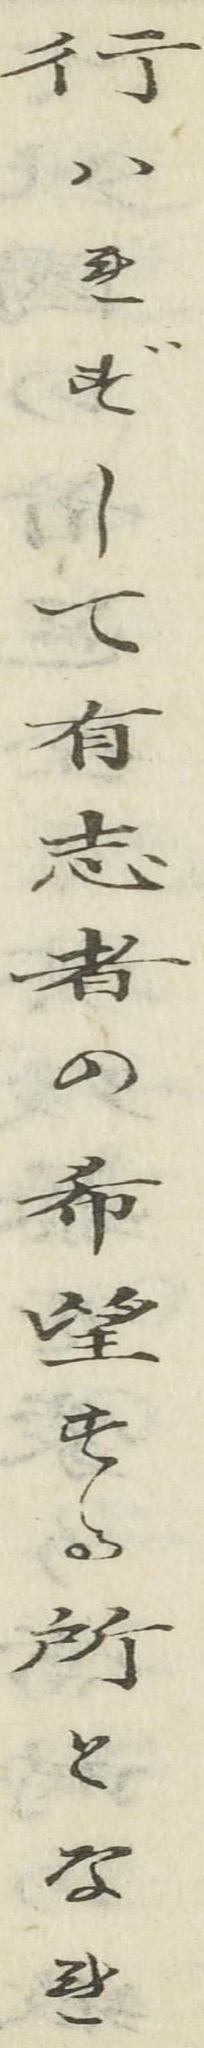行はれずして有志者の希望する所となれ
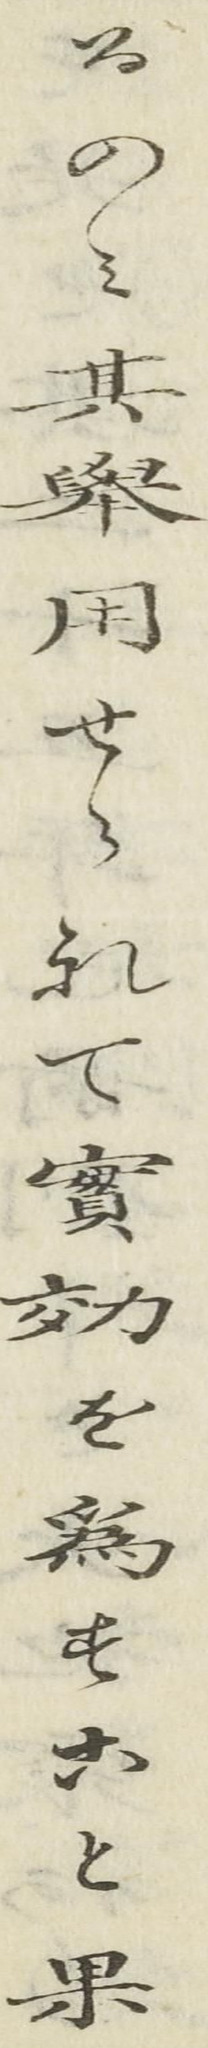るのみ其挙用せられて実効を為すこと果
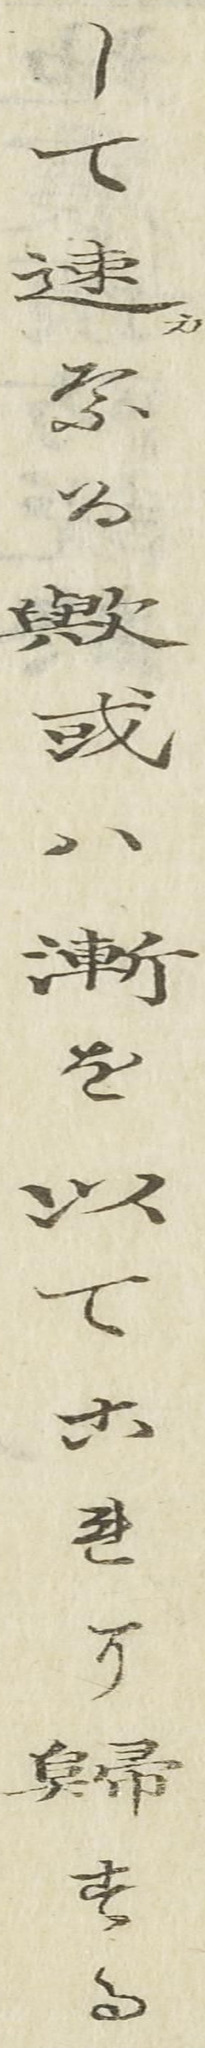して速かなる歟或は漸を以てこれに帰する
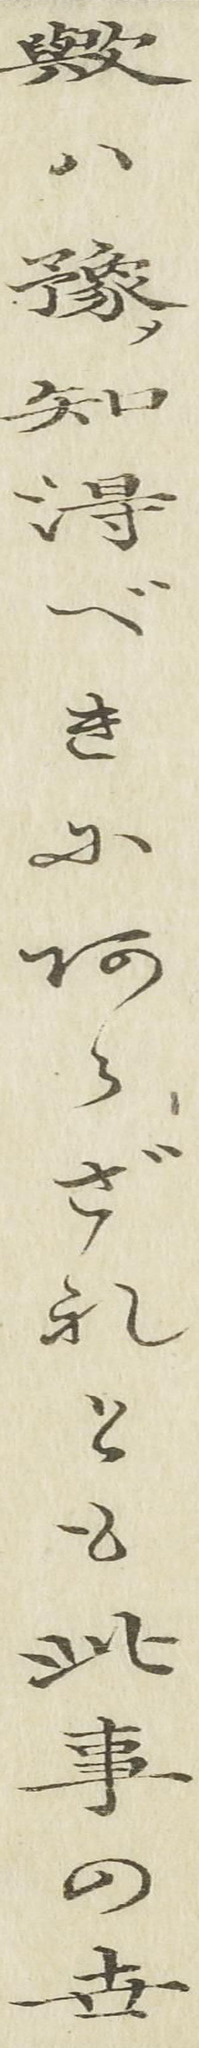歟は予め知得べきにあらざれとも此事の世
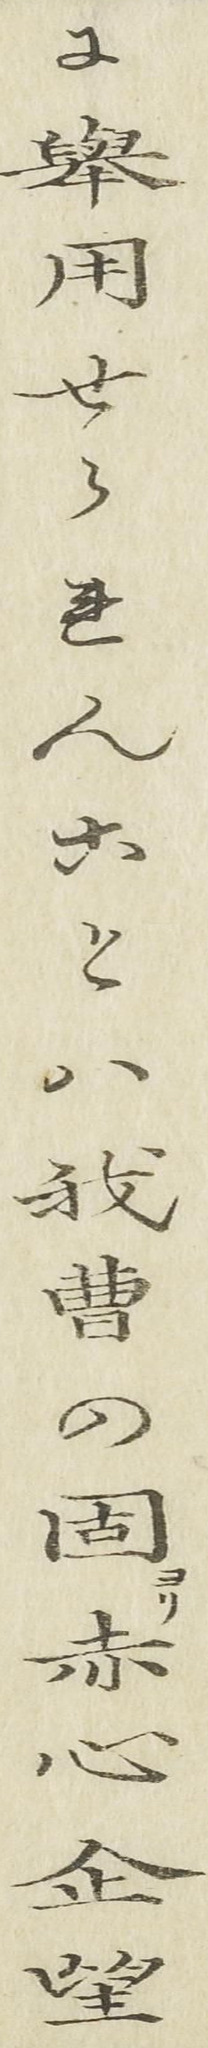に挙用せられんことは我曹の固より赤心企望
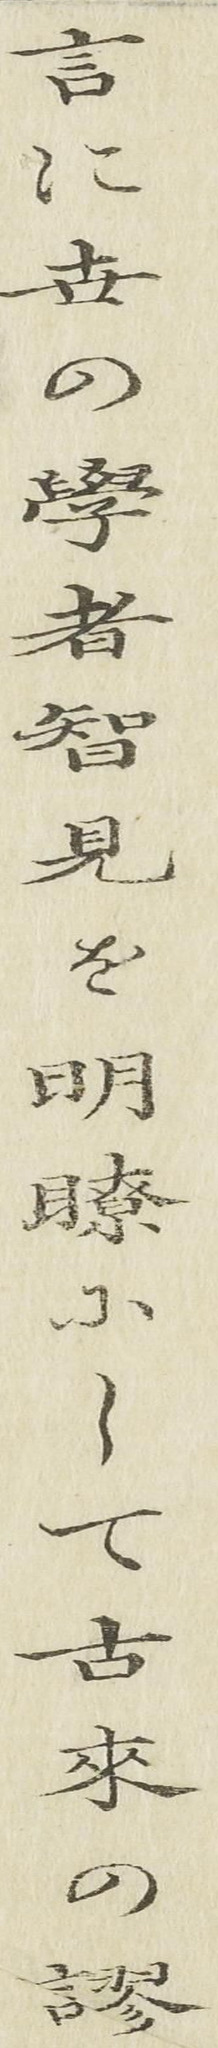言に世の学者智見を明瞭にして古来の謬
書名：地震預防説
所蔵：東京大学地震研究所図書室 Earthquake Research Institute Library, The University of Tokyo, JAPAN
